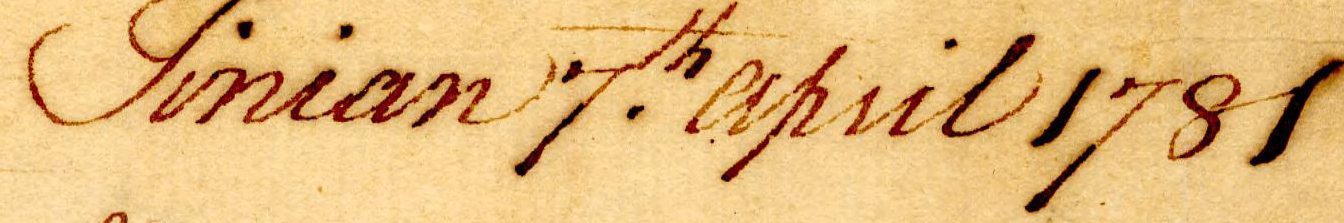Tinian 7^th. April 1781
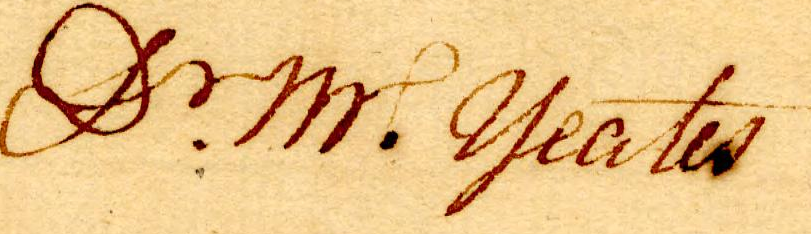D^r. M^r. Yeates
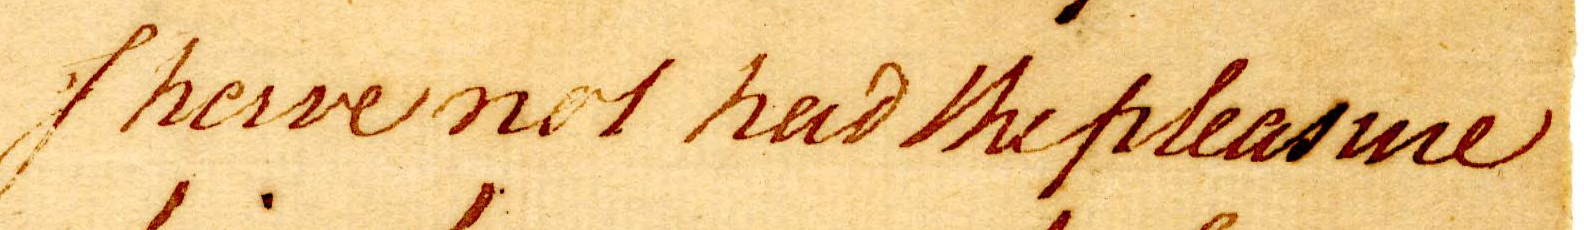I have not had the pleasure
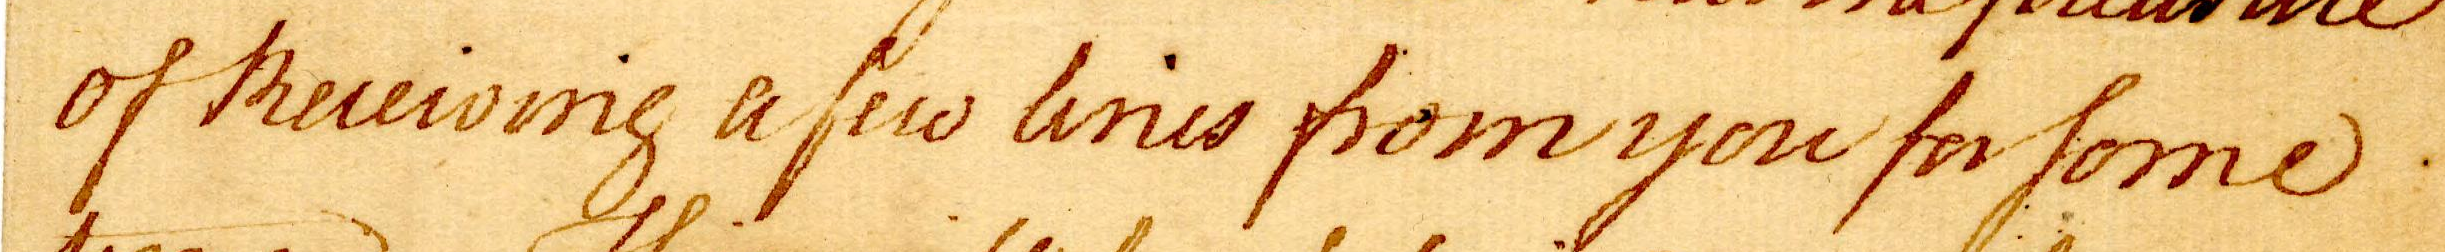of Receiving a few lines from you for some
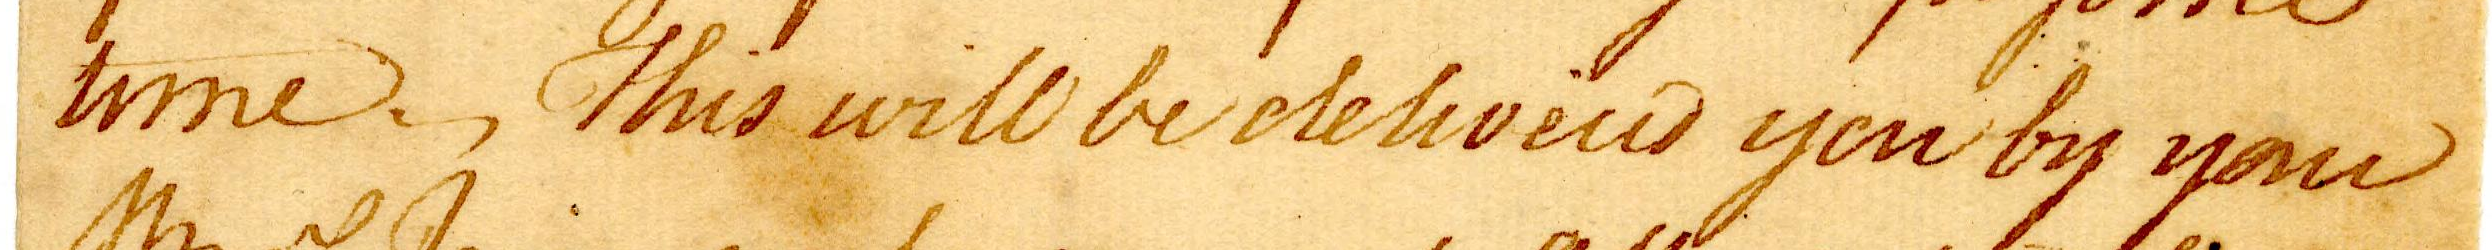time. This will be delivered you by your
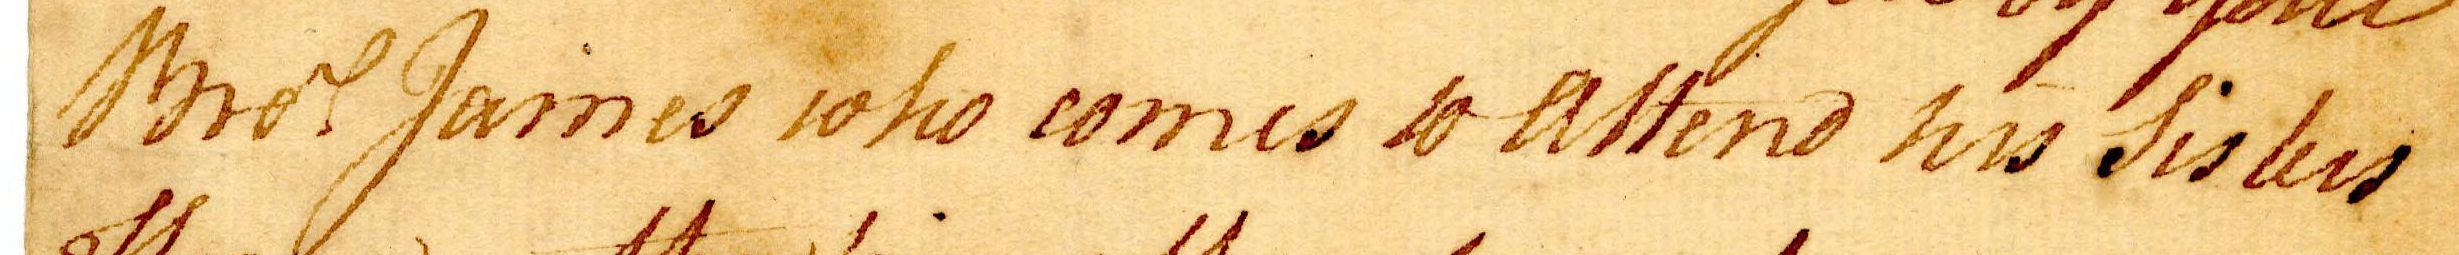Bro^r. James who comes to attend his Sisters
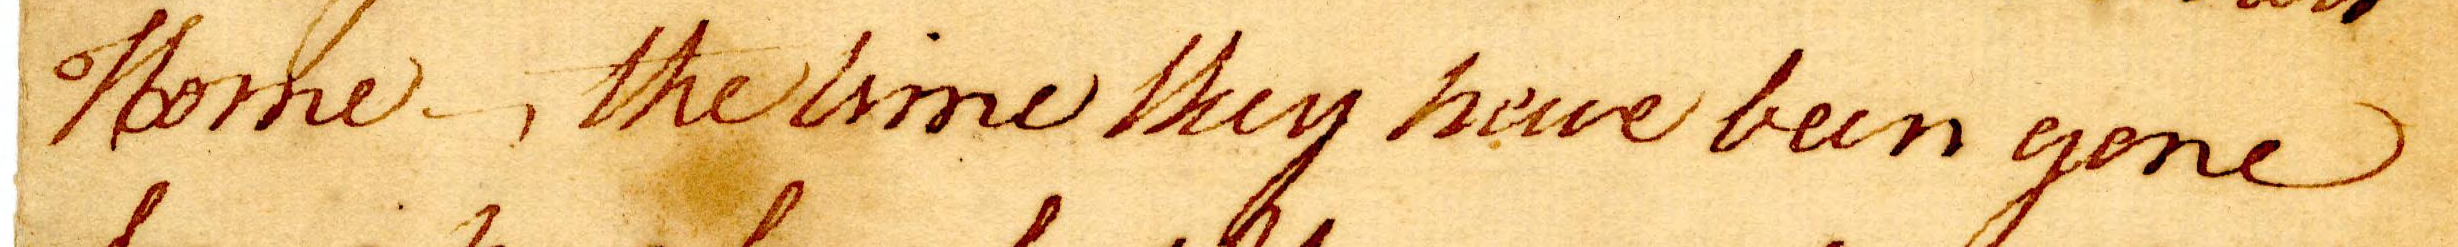Home- the time they have been gone
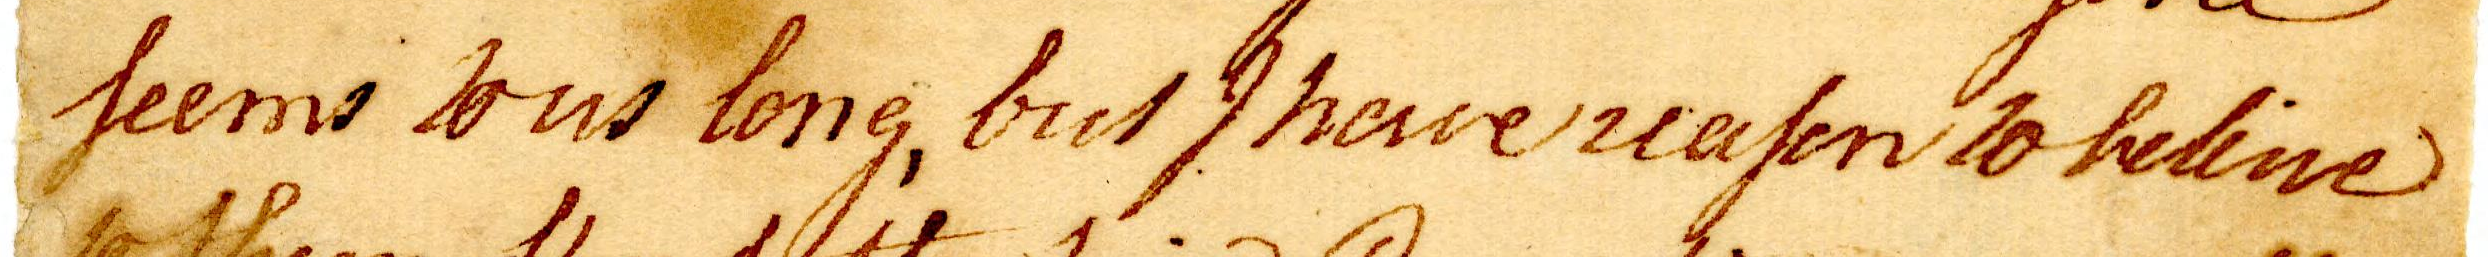seems to us long, but I have reason to believe
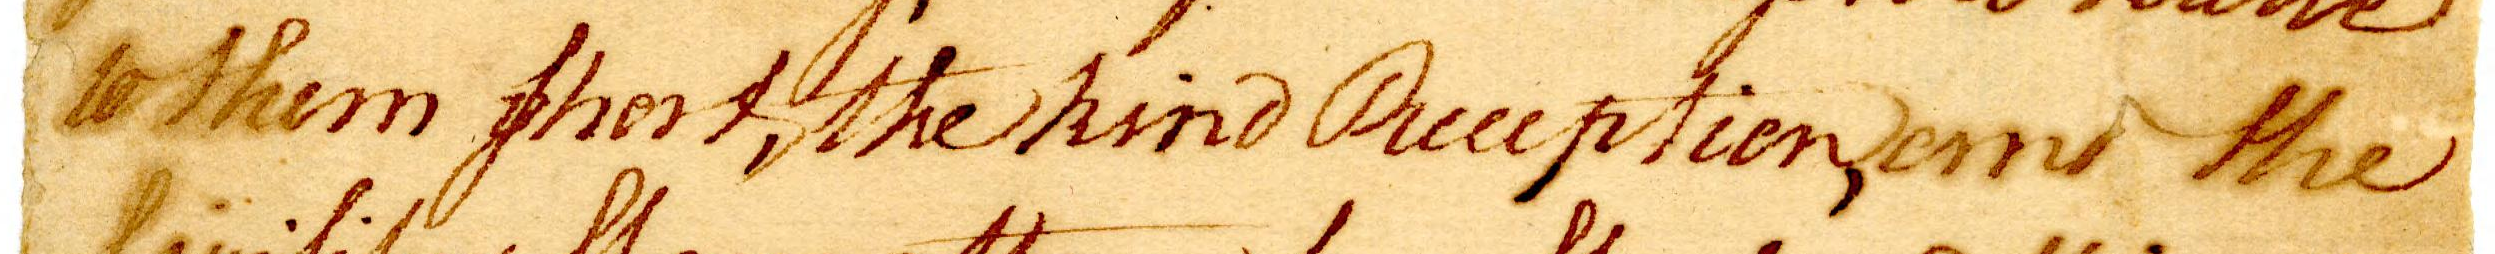to them short, the kind Preception, and the
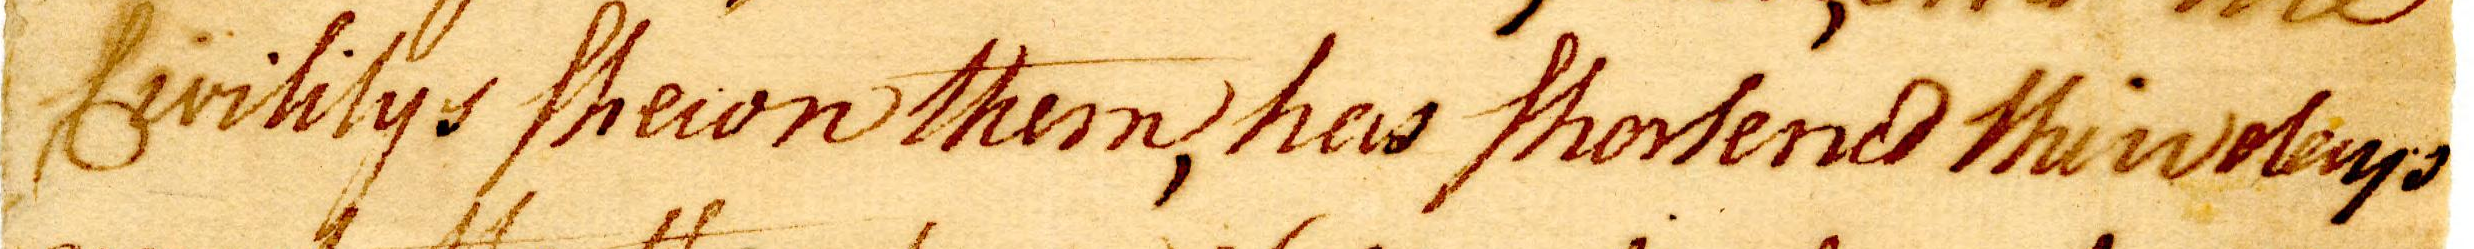Civilitys shewn them, has shortened their days
